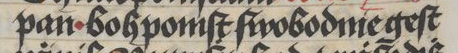pan.boh pomſt ſwobodnie geſt
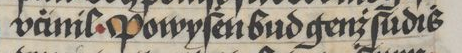uċinil.Powyẛen bud genż ſudiṡ
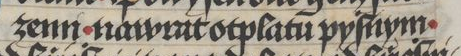zemi.nawrat otplatu pyẛnym.
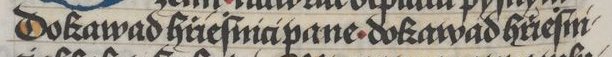Dokawad hřieẛnici pane.dokawad hṙíeẛní¬
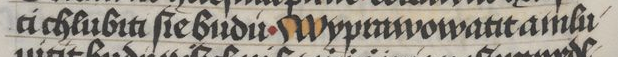ci chlubiti ſie budú.Wyprawowatit a mlu¬
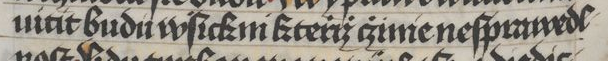uitit budu wẛickni kteṙiż cżinie neſprawedl¬
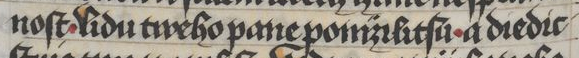noſt.lidu tweho pane poniżilit ſu.a diedic¬
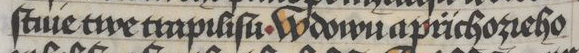ſtuie twe trapiliſu.Wdowu a pṙíchozieho
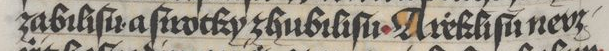zabiliſu.a ſirotky zhubiliſu.A ṙekliſu nevz¬
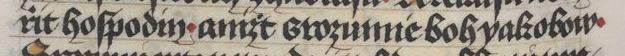ṙít hoſpodin.aniżt srozumie boh yakobow.
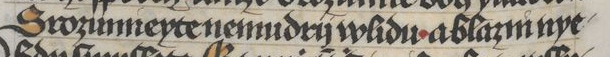Srozumieyte nemudrij wlidu.a blazni nye¬
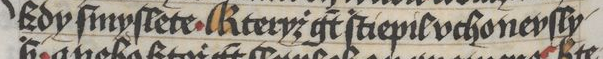kdy ſmyſlete.Kteryż ḡt ẛtiepil vcho nevſly¬
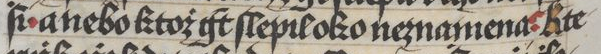ẛi.a nebo ktoż ḡt ſlepil oko neznamena. Kte¬
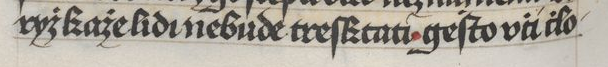ryż każe lidi nebude treſktati.geẛto vċi ċlo¬
